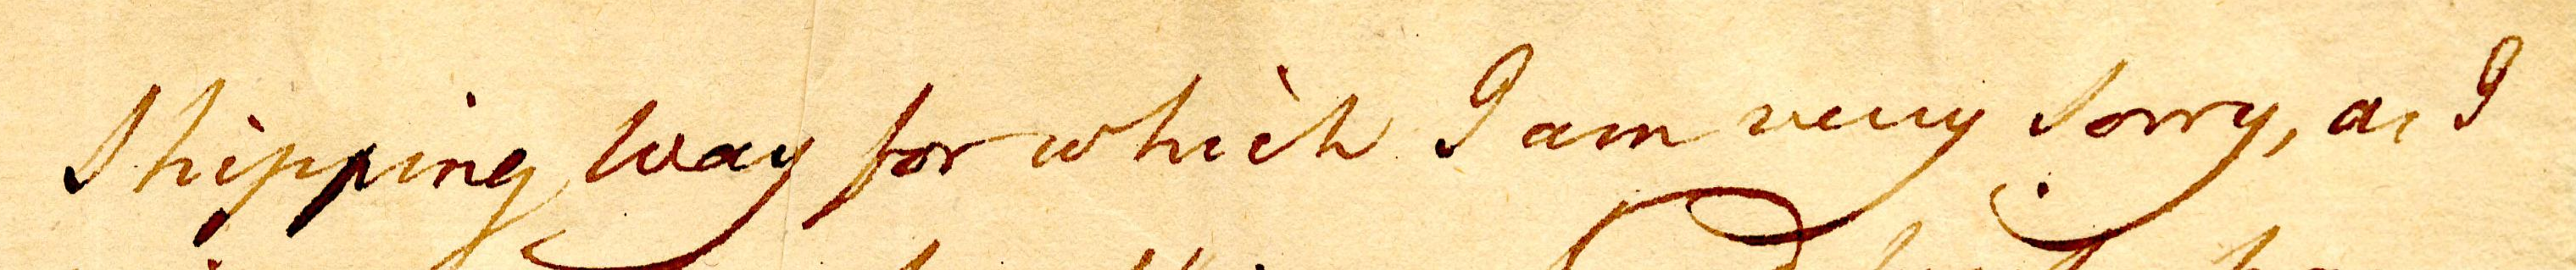Shipping way for which I am very Sorry, as I
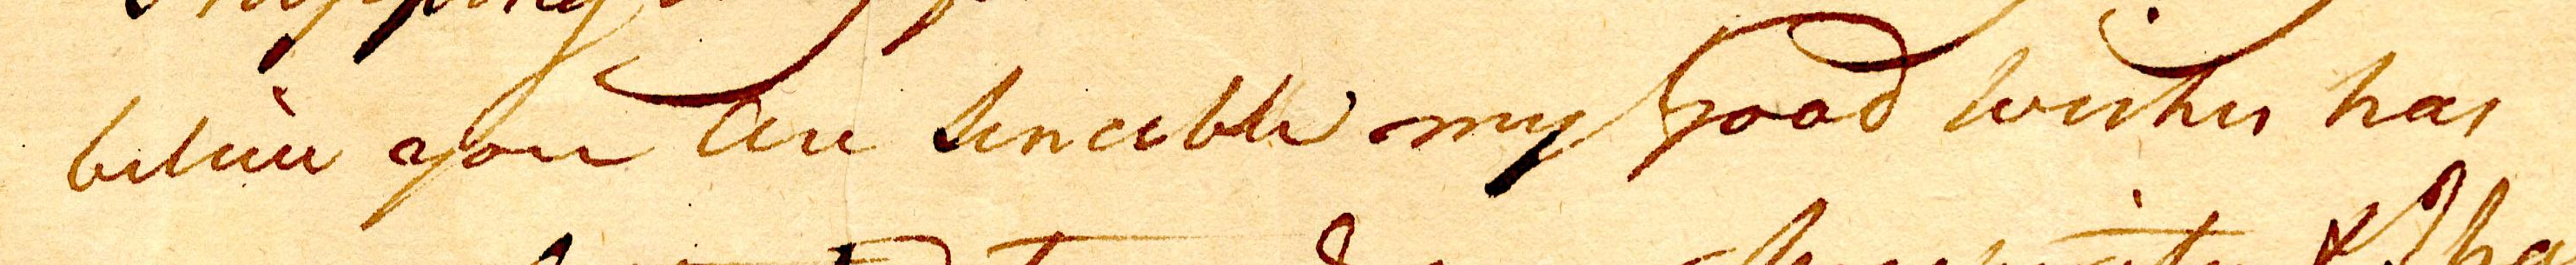belive you are sencible my Good wishes has
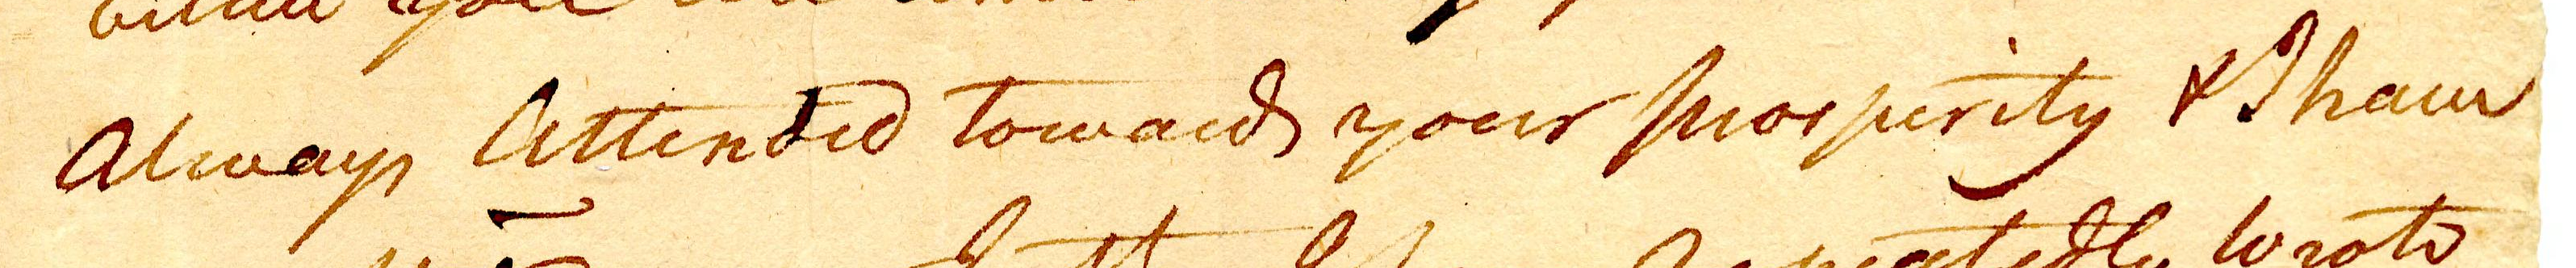Always Attended towards your prosperity & I have
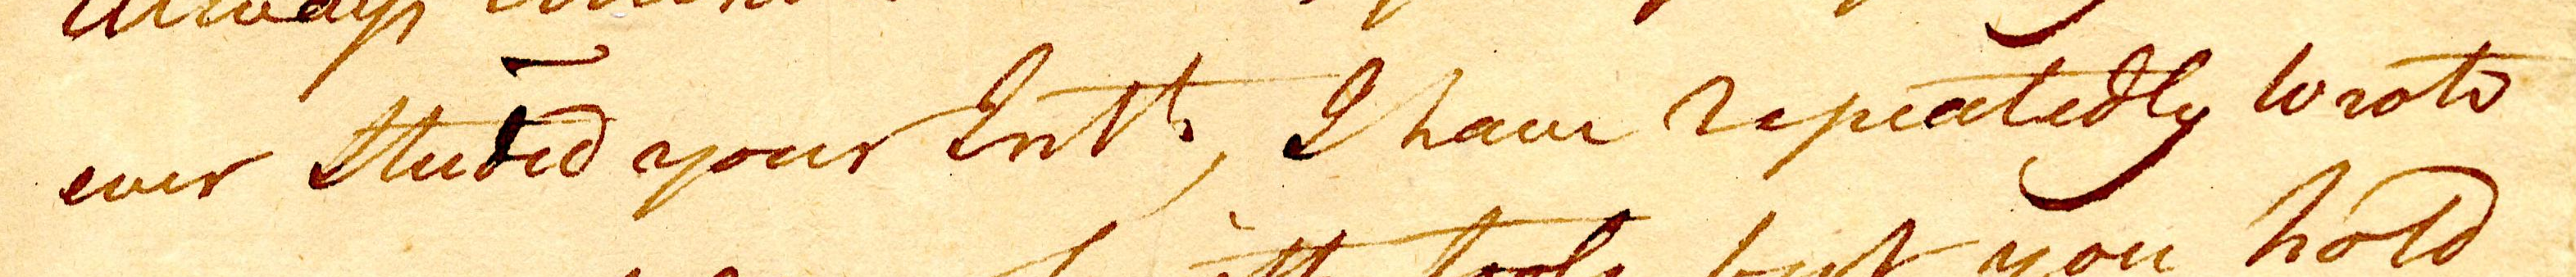ever studied your Int^t. I have repeatedly wrote
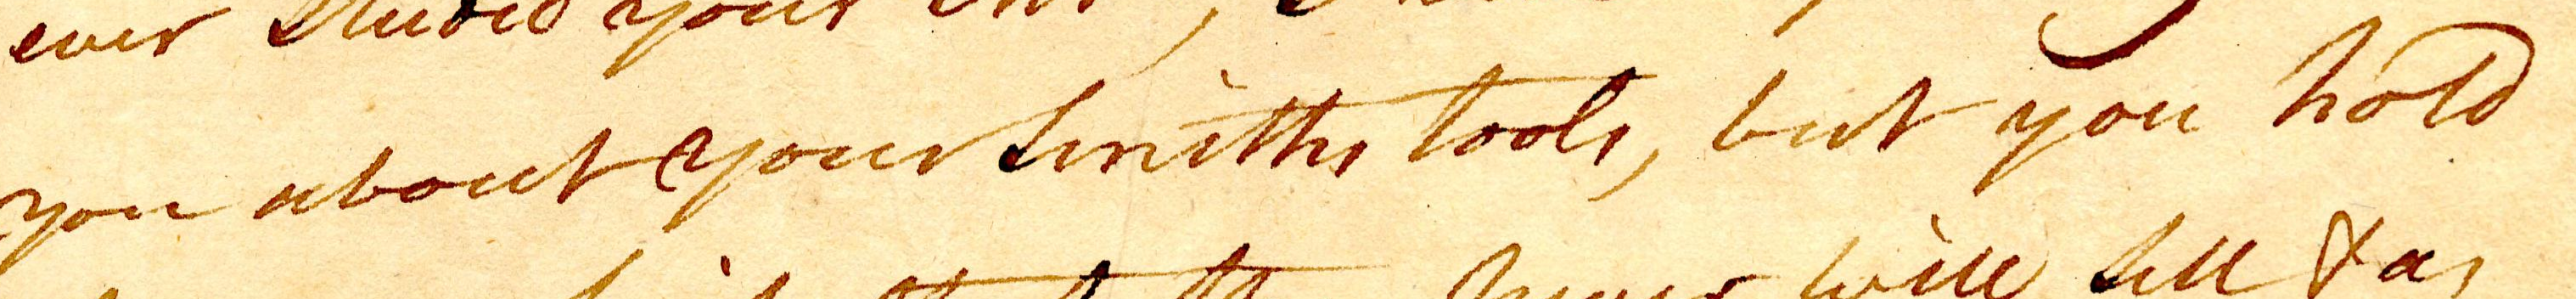you about your Smiths tools, but you hold
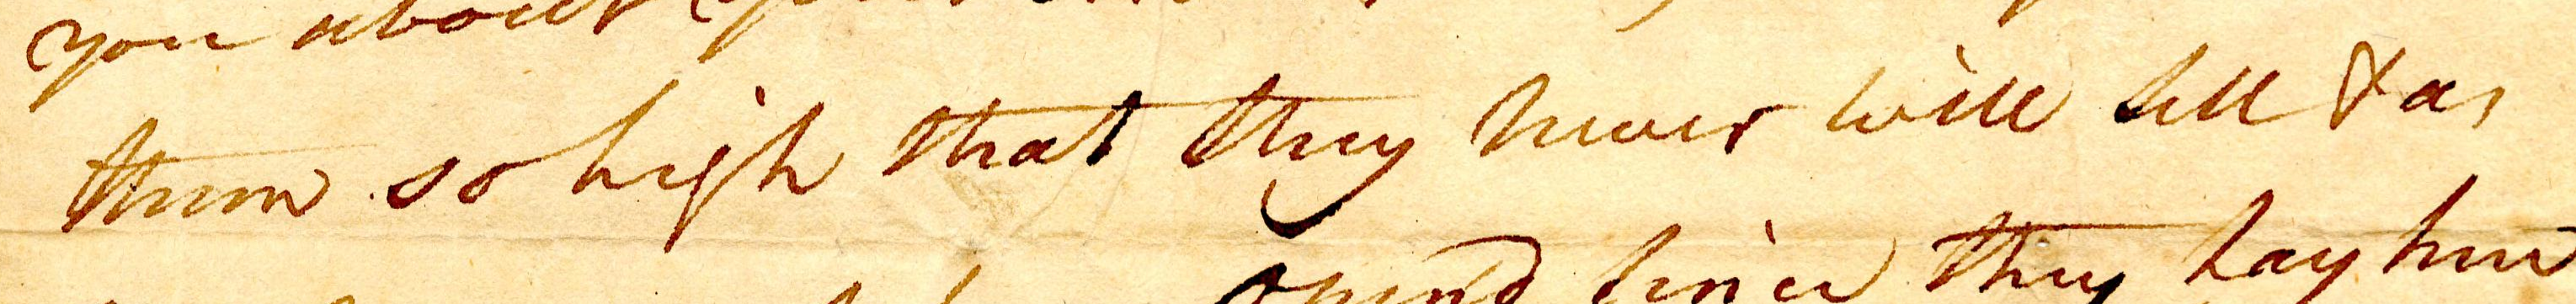them so high that they hear will sell & as
